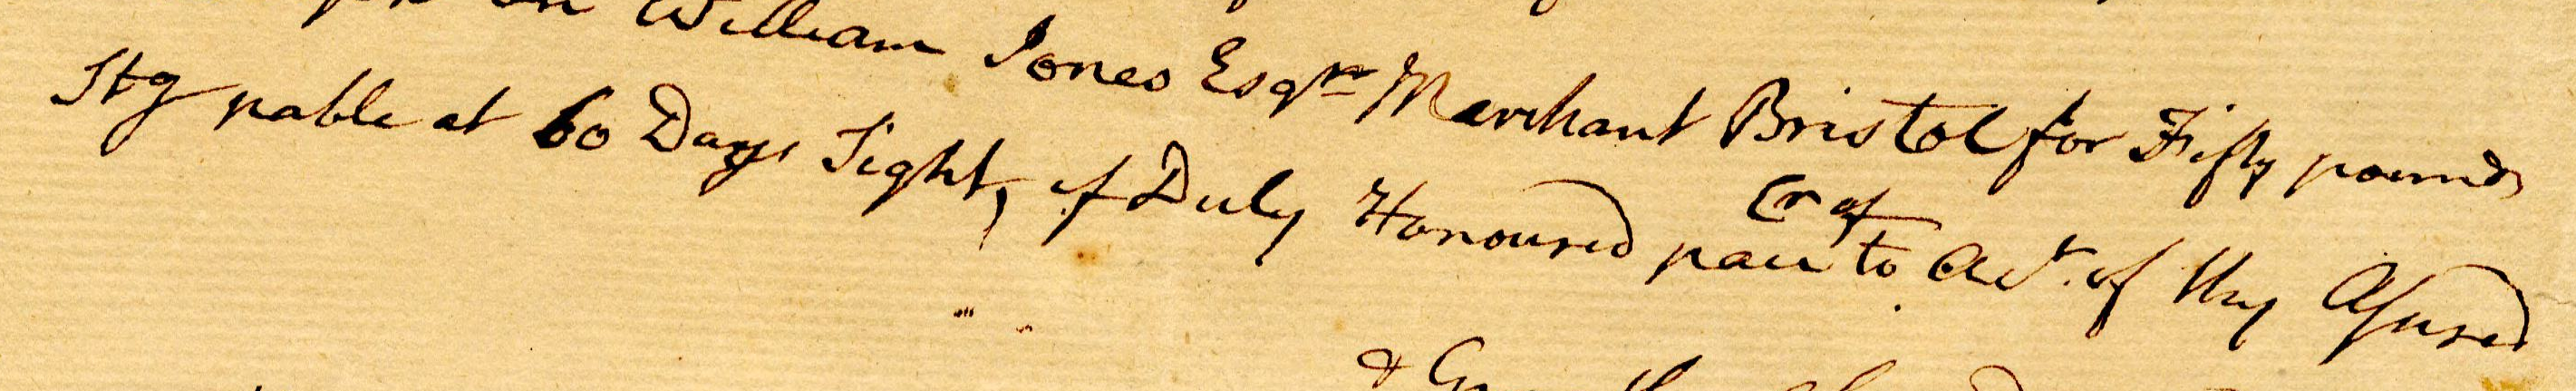st^g pable at 50 Days Tight, of Duly Honoured pace ^Cr ^of to Ac^t of thy Asused
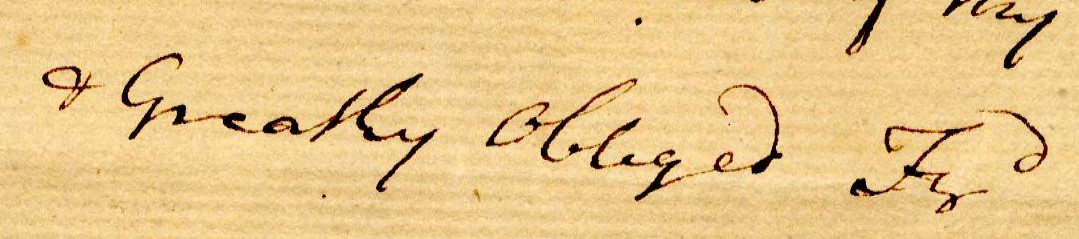& Greatly obliged Fr^d
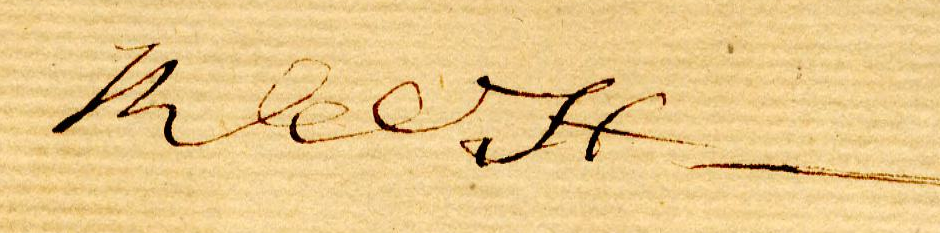R H-
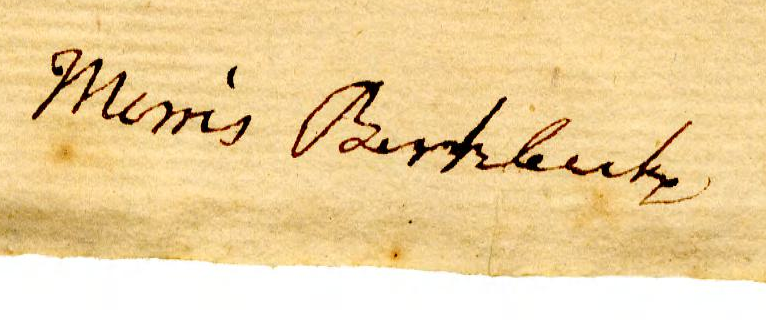Morris Berkbeck
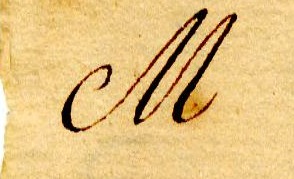M
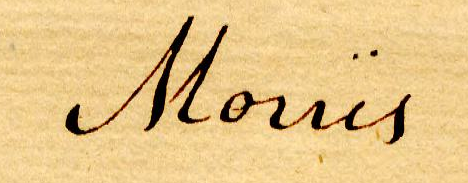Morris
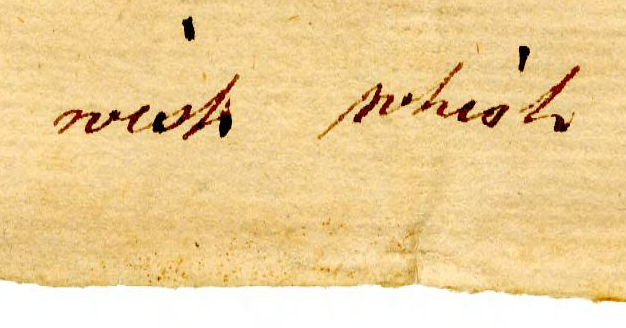wish whish
